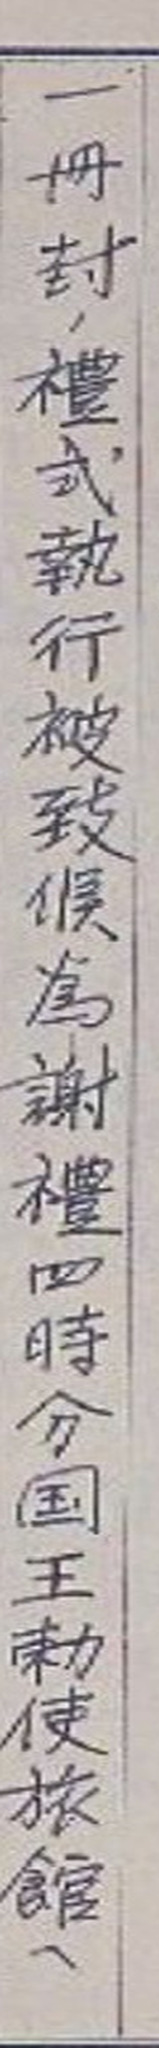一冊封の礼式執行被致候為謝礼四時分国王勅使旅館へ
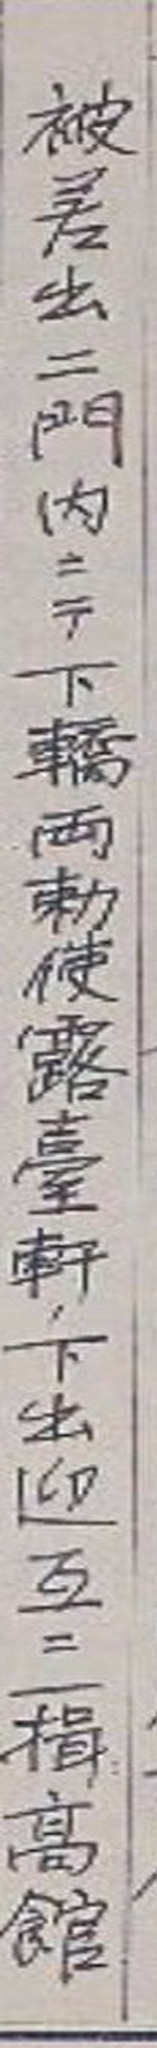被差出二門内にて下轎両勅使露台軒の下出迎互に一揖高館
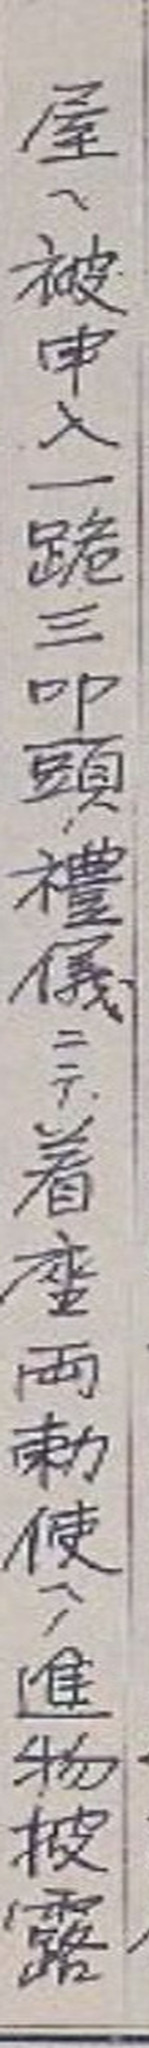屋へ被申入一跪三叩頭の礼儀にて着座両勅使への進物披露
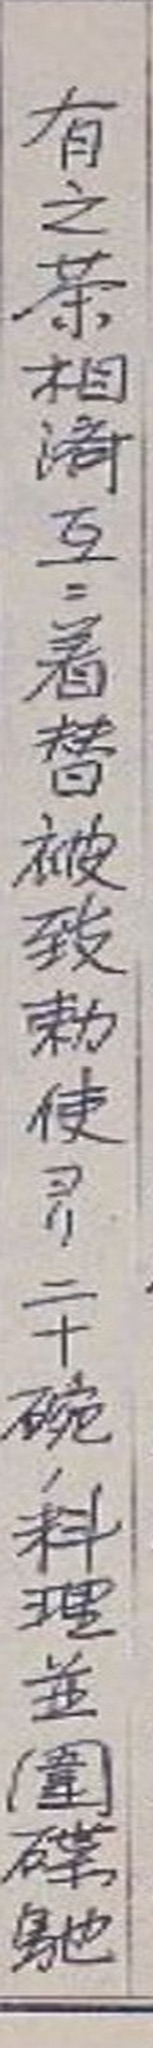有之茶相済互に着替被致勅使より二十碗の料理並囲碟馳
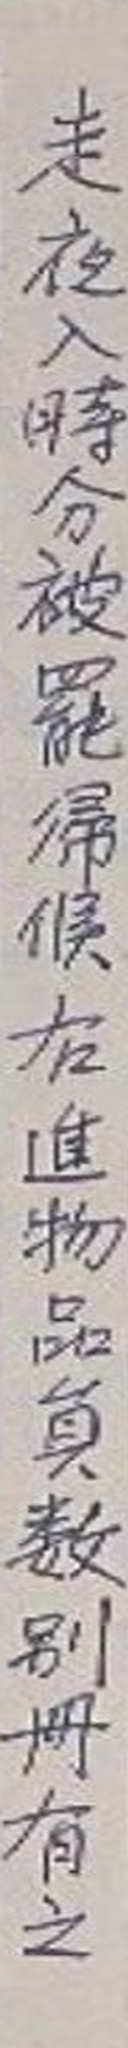走夜入時分被罷帰候右進物品員数別冊有之
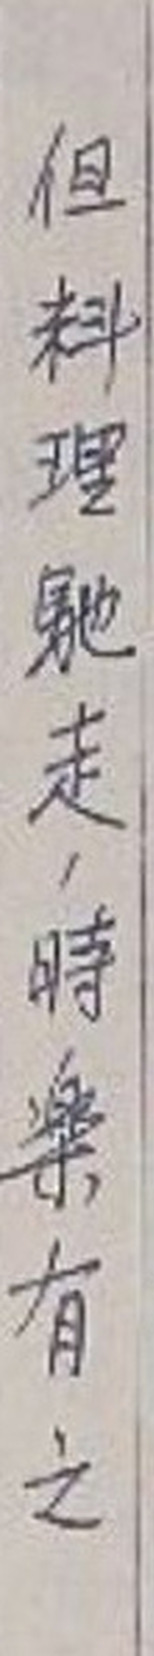但料理馳走の時楽有之
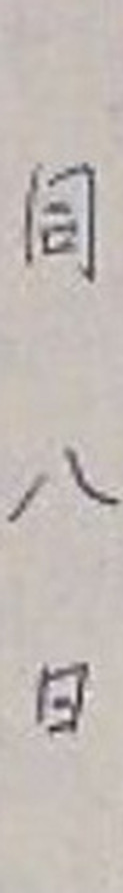同八日
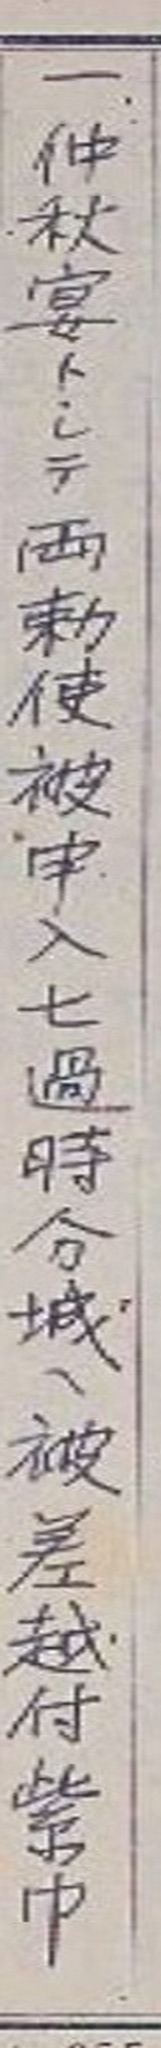一仲秋宴として両勅使被申入七過時分城へ被差越付紫巾
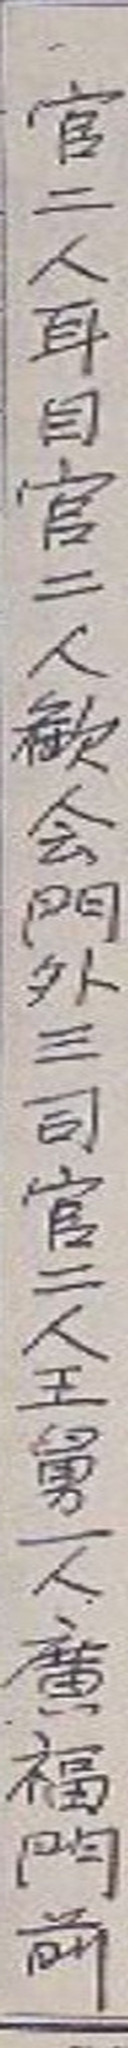官二人耳目官二人歓会門外三司官二人王舅一人広福門前
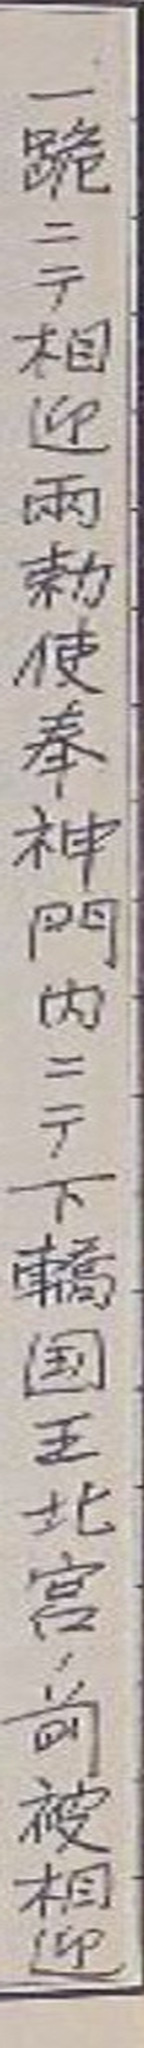一跪にて相迎両勅使奉神門内にて下轎国王北宮の前被相迎
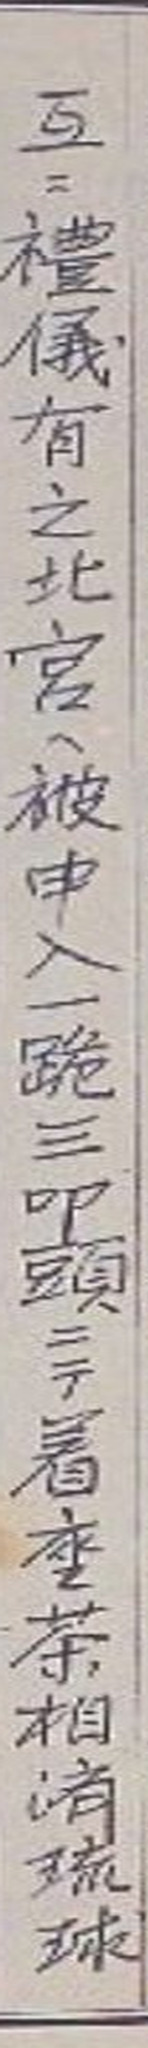互に礼儀有之北宮へ被申入一跪三叩頭にて着座茶相済琉球
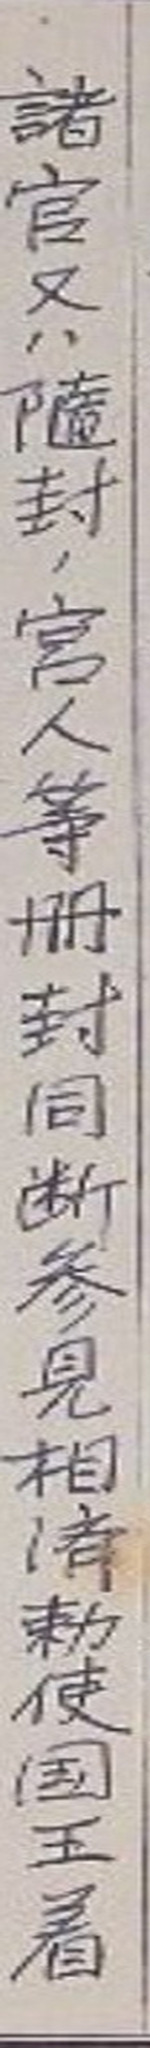諸官又は随封の宮人等冊封同断参見相済勅使国王着
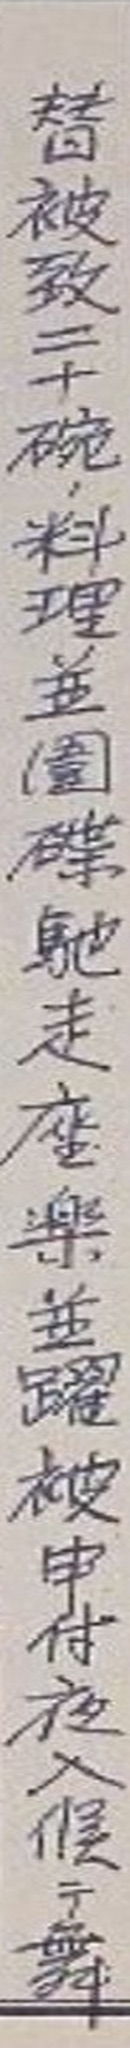替被致二十碗の料理並囲碟馳走座楽並躍被申付夜入候て舞
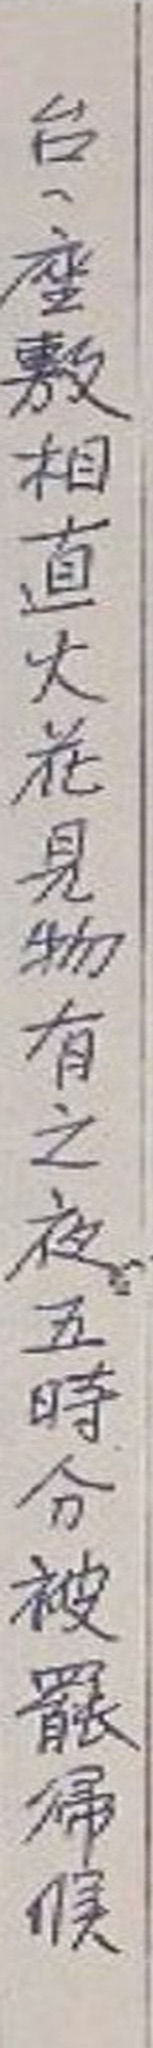台へ座敷相直火花見物有之夜五時分被罷帰候
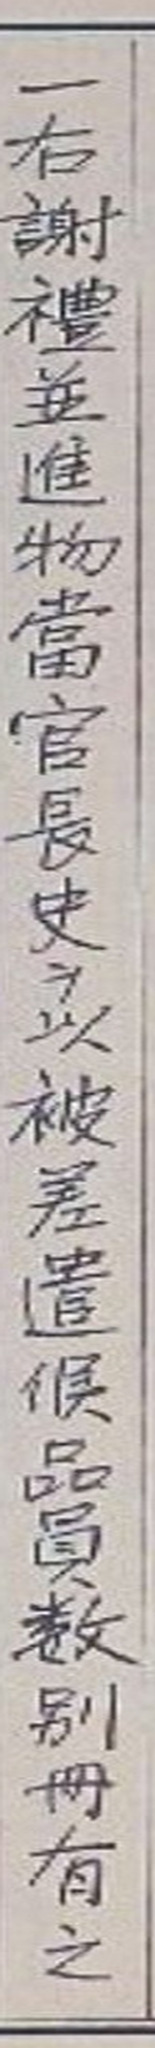一右謝礼並進物当官長史を以被差遣候品員数別冊有之
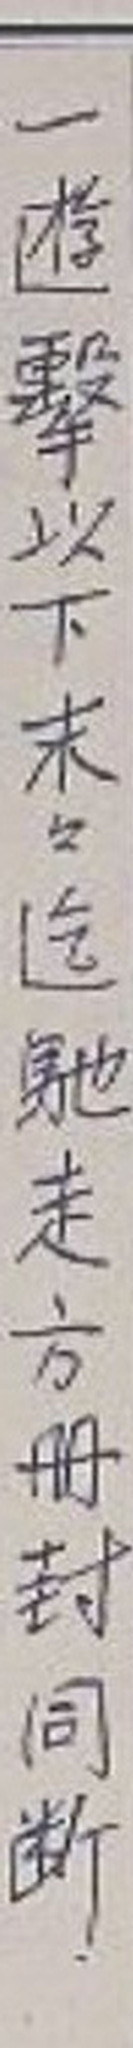一遊撃以下末々迄馳走方冊封同断
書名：支那冊封使来琉諸記 下巻
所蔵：University of the Ryukyus Library
